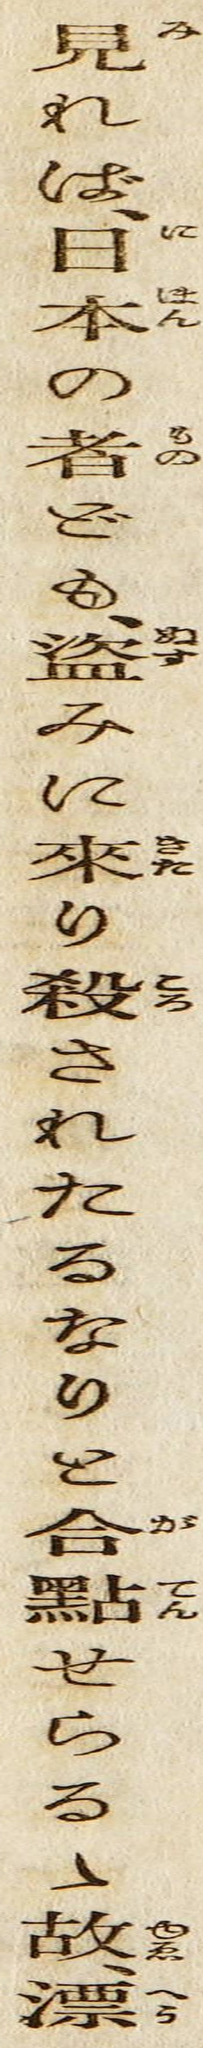見れば、日本の者ども、盗みに来り殺されたるなりと合点せらるゝ故、漂
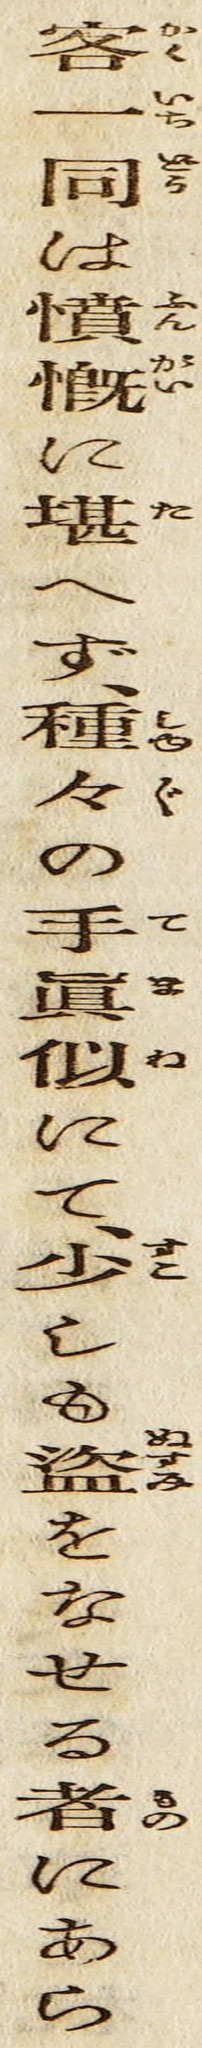客一同は憤慨に堪へず、種々の手真似にて、少しも盗をなせる者にあら
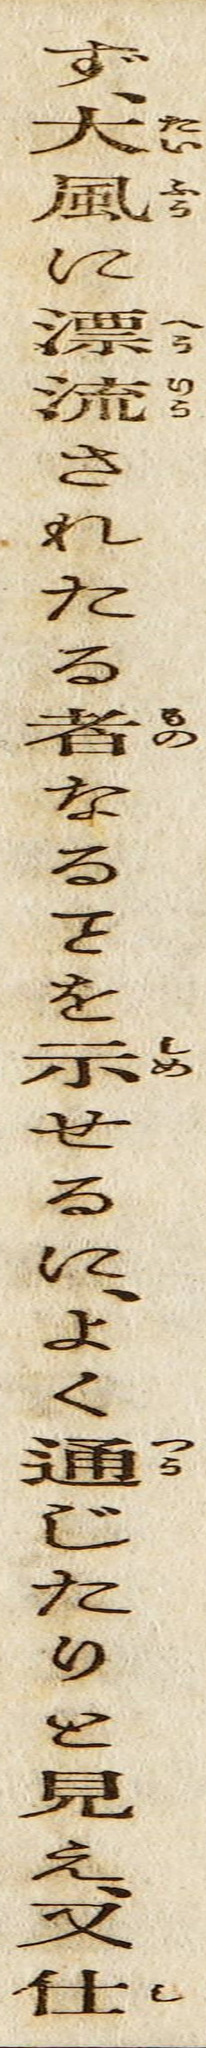ず、大風に漂流されたる者なることを示せるに、よく通じたりと見え、又仕
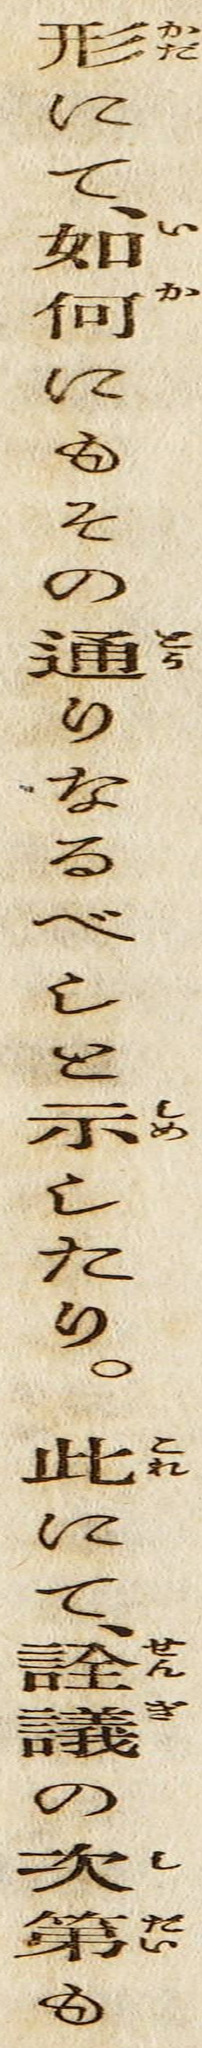形にて、如何にもその通りなるべしと示したり。此にて、詮議の次第も
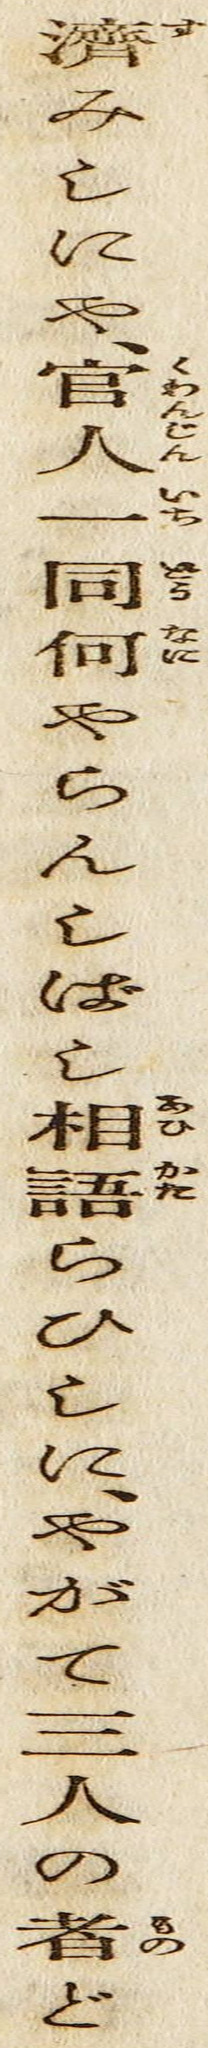済みしにや、官人一同何やらんしばし相語らひしに、やがて三人の者ど
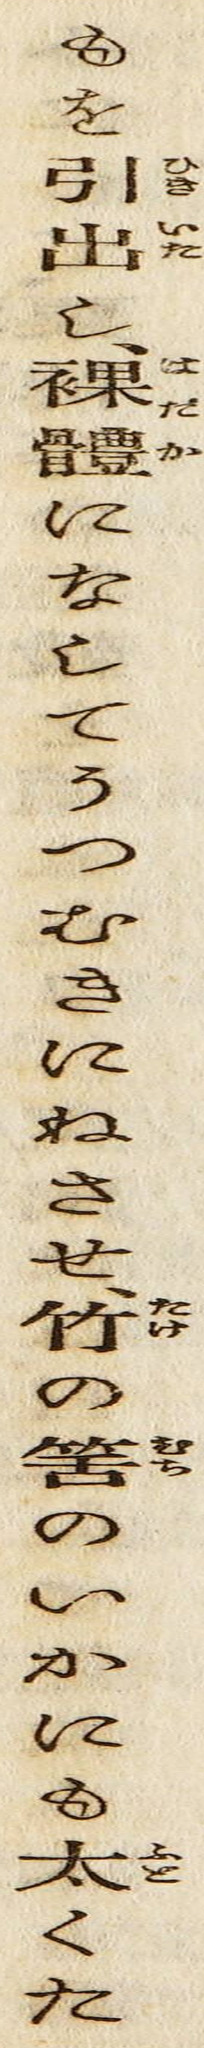もを引出し、裸体になしてうつむきにねさせ、竹の筈のいかにも太くた
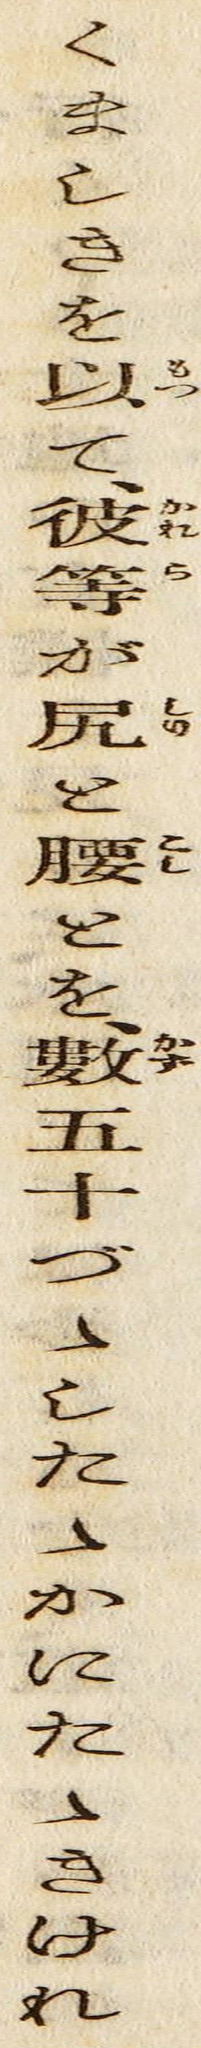くましきを以て、彼等が尻と腰とを、数五十づゝしたゝかにたゝきけれ
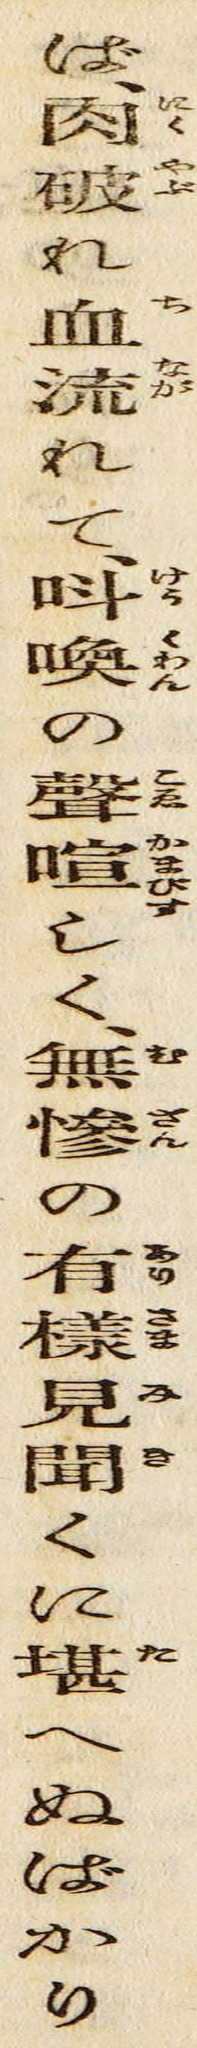ば、肉破れ血流れて、呌喚の声喧しく、無惨の有様見聞くに堪へぬばかり
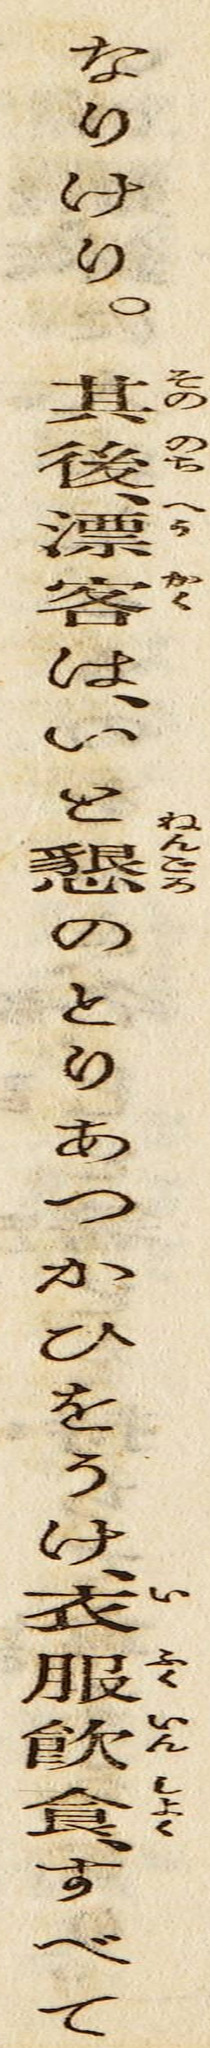なりけり。其後、漂客は、いと懇のとりあつかひをうけ、衣服飲食、すべて
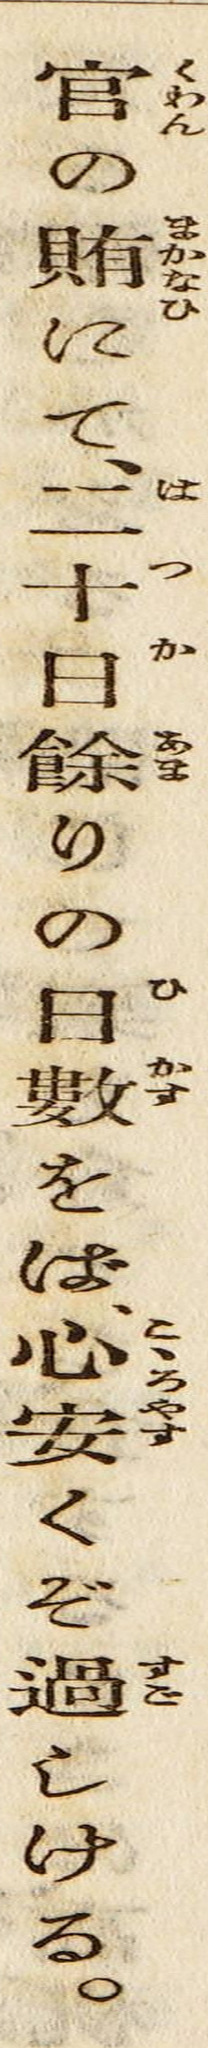官の賄にて、二十日余りの日数をば、心安くぞ過しける。
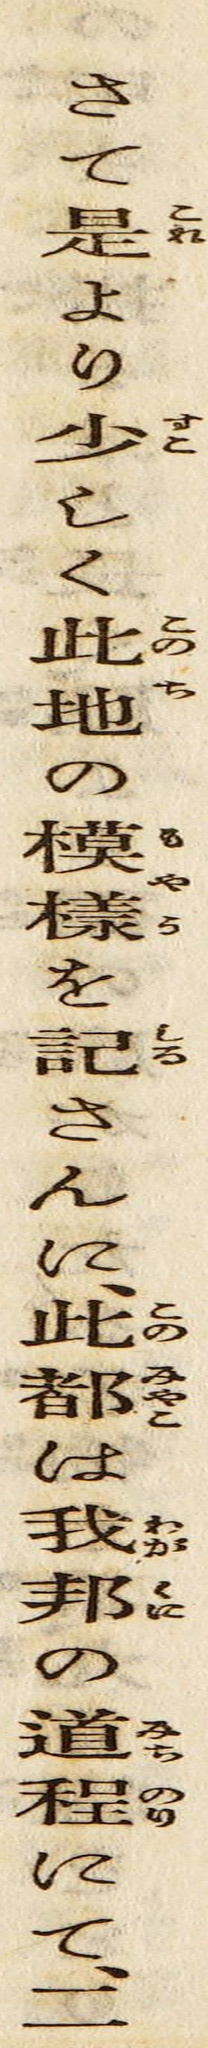さて是より少しく此地の模様を記さんに、此都は我邦の道程にて、二
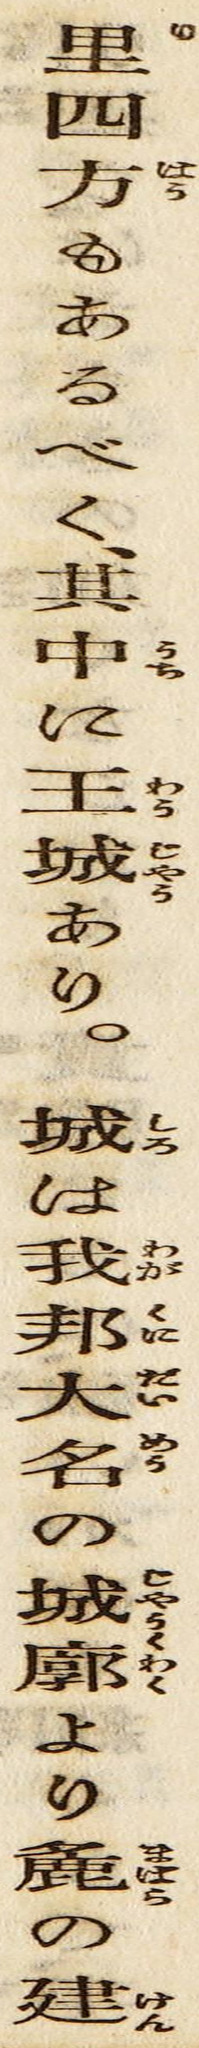里四方もあるべく、其中に王城あり。城は我邦大名の城郭より麤の建
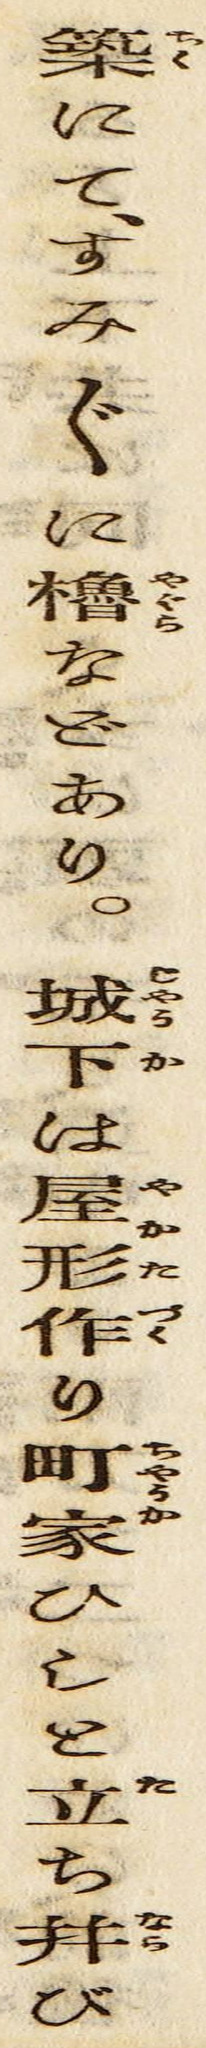築にて、すみ〴〵に櫓などあり。城下は屋形作り町家ひしと立ち并び
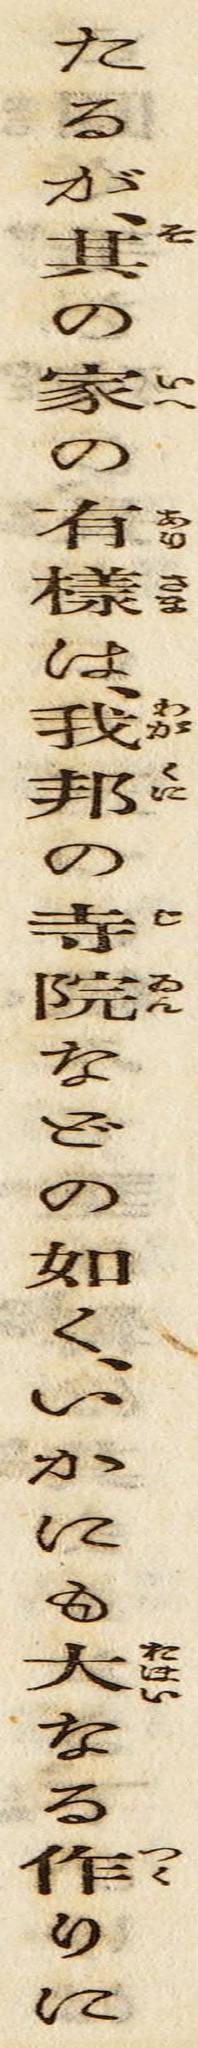たるが、其の家の有様は、我邦の寺院などの如く、いかにも大なる作りに
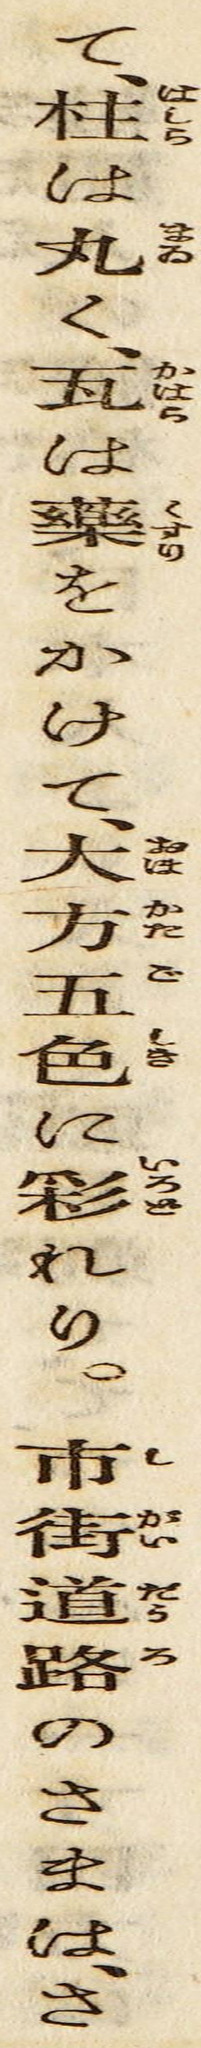て、柱は丸まゐく、瓦は薬をかけて、大方五色に彩れり。市街道路のさまは、さ
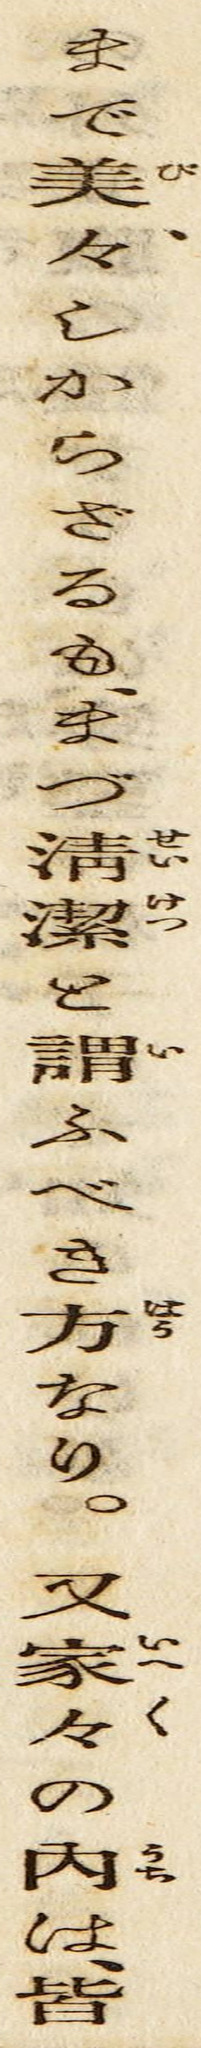まで美々しからざるも、まづ清潔と謂ふべき方なり。又家々の内は、皆
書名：日本漂流譚
